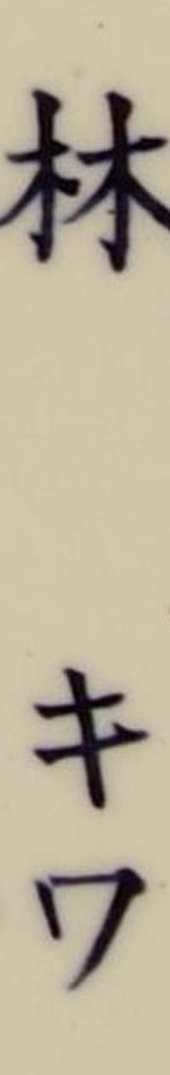林キワ
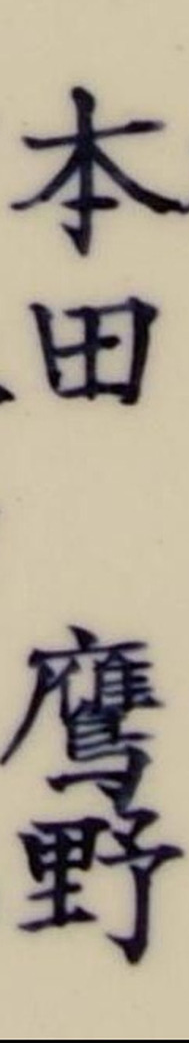本田鷹野
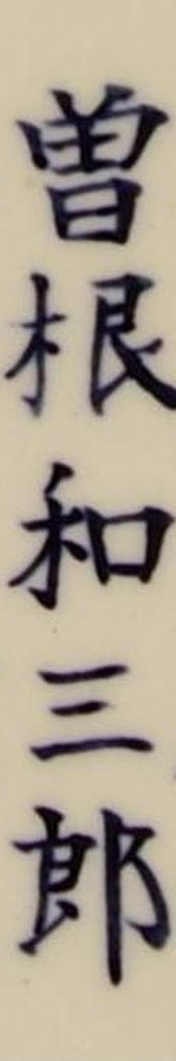曽根和三郎
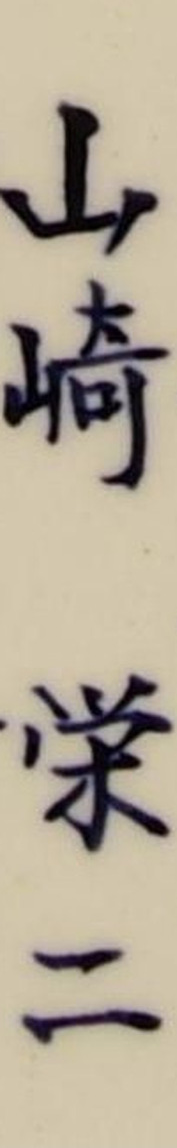山崎栄二
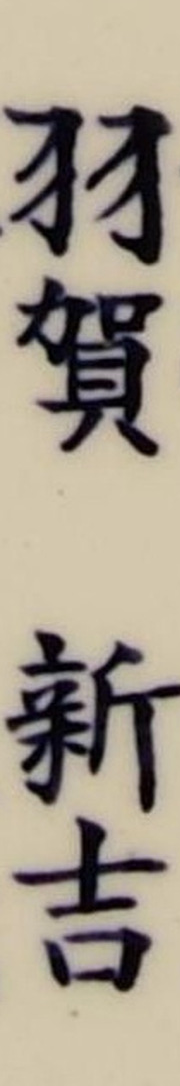羽賀新吉
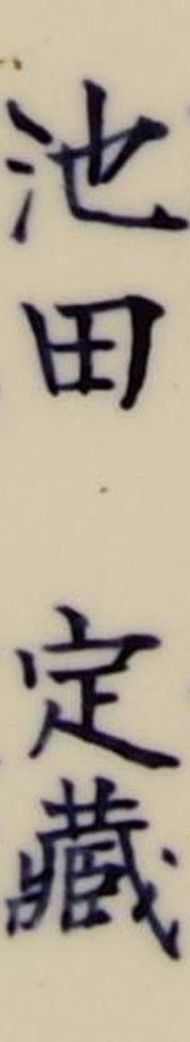池田定蔵
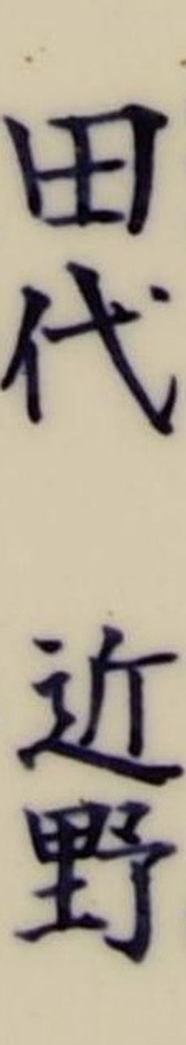田代近野
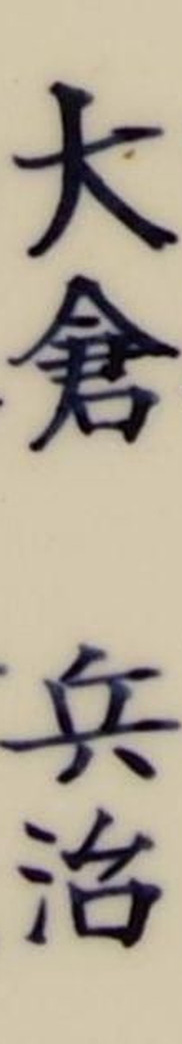大倉兵治
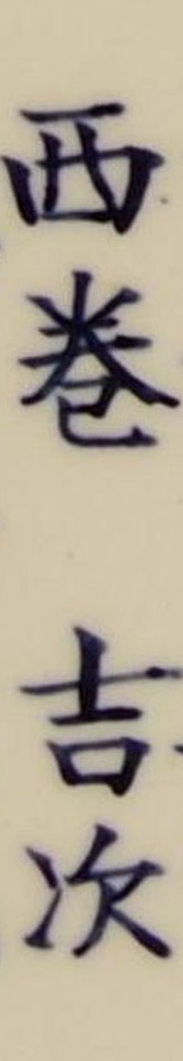西巻吉次
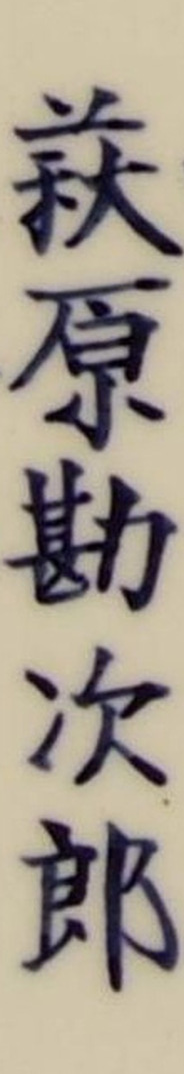萩原勘次郎
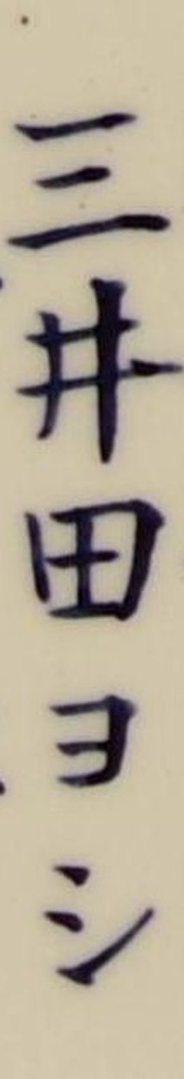三井田ヨシ
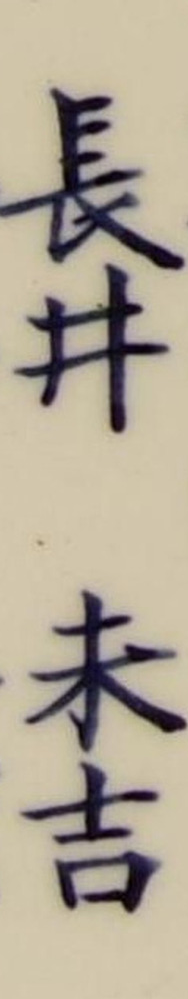長井未吉
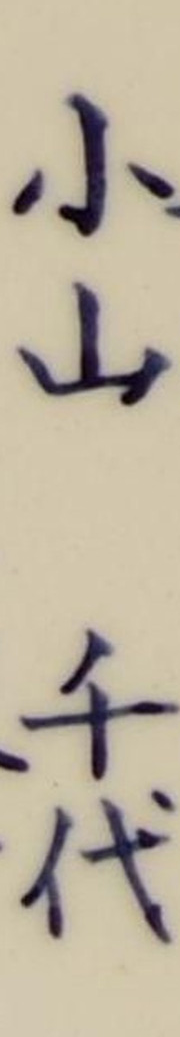小山千代
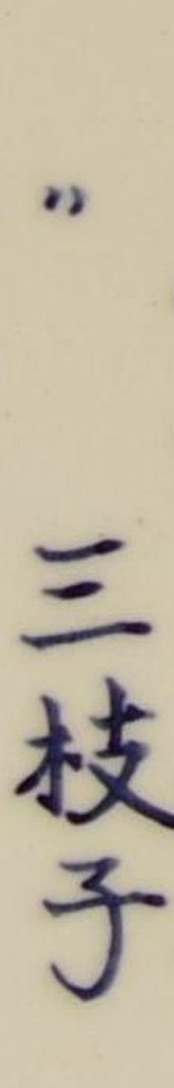三枝子
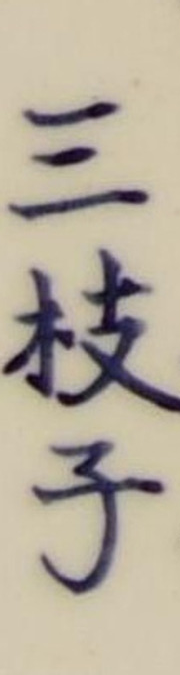三枝子
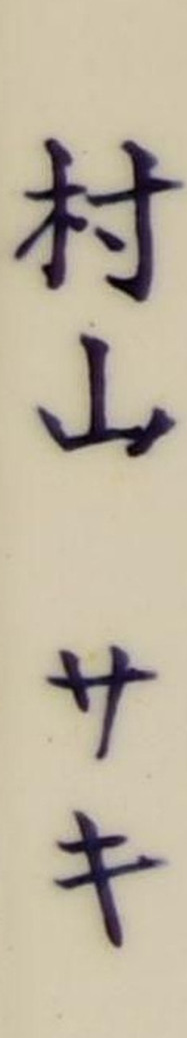村山サキ
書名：E~L
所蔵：高野山金剛峯寺
